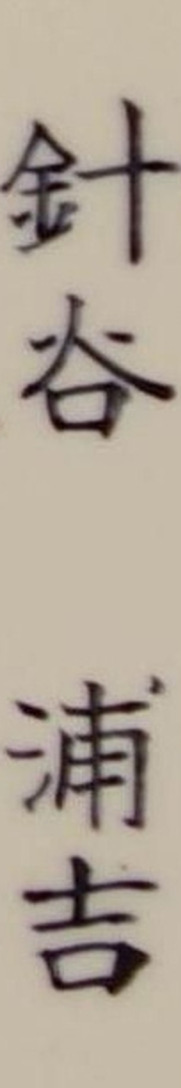針谷浦吉
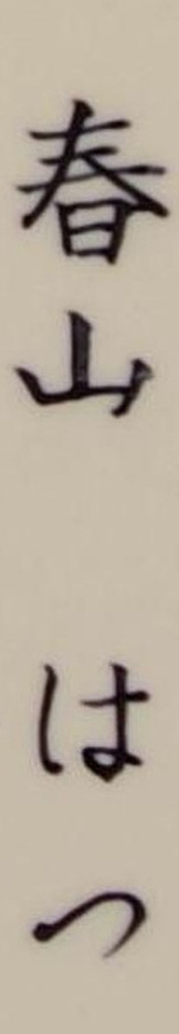春山はつ
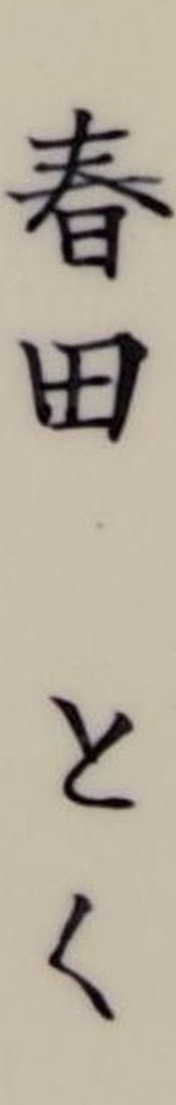春田とく
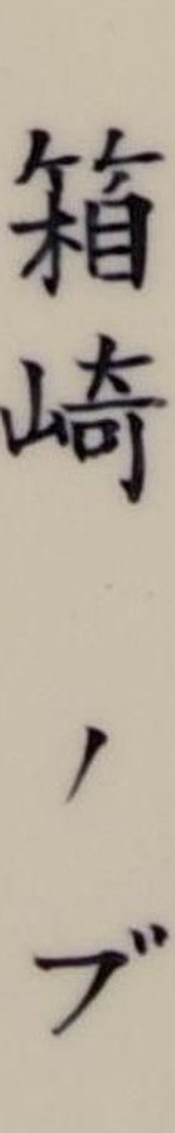箱崎ノブ
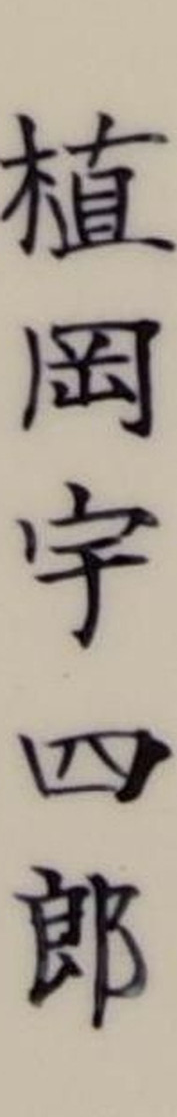植岡宇四郎
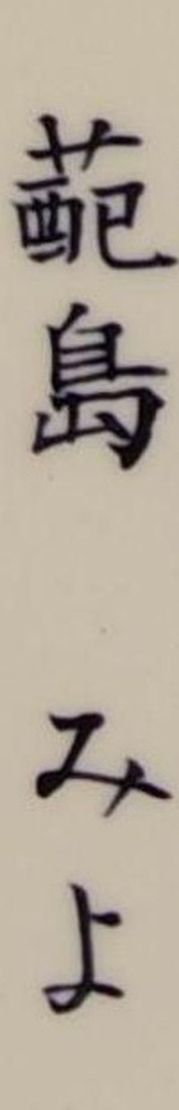蓜島みよ
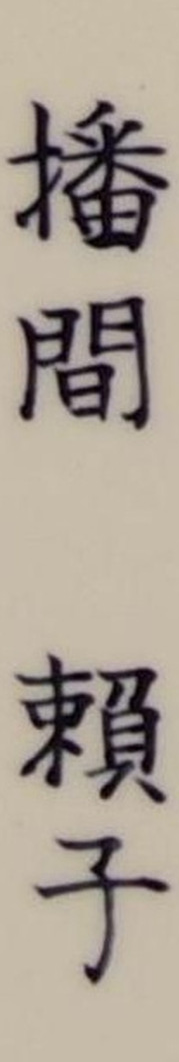播間頼子
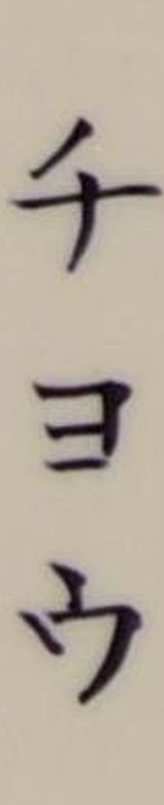チヨウ
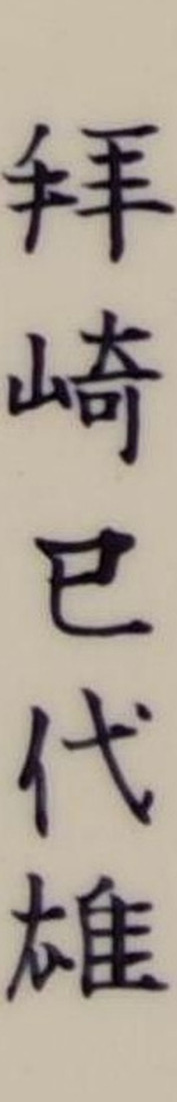拝崎巳代雄
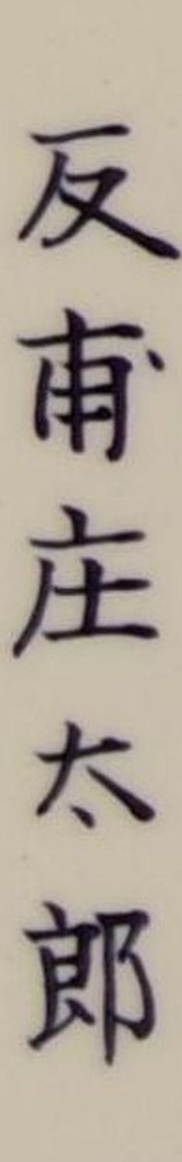反甫庄太郎
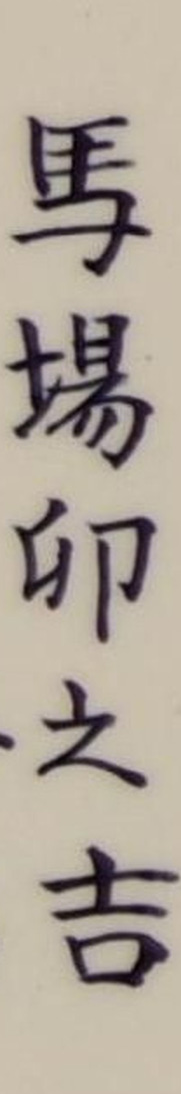馬場卯之吉

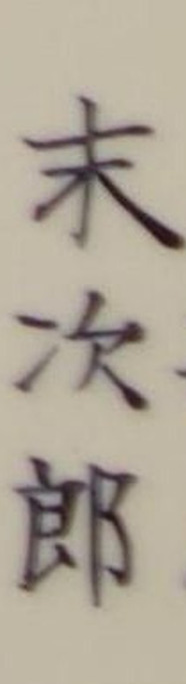末次郎
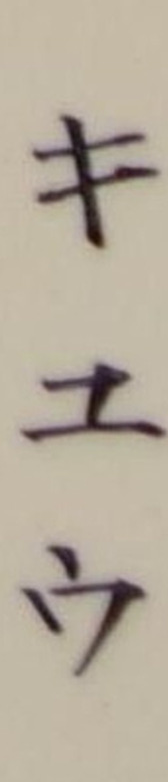キユウ
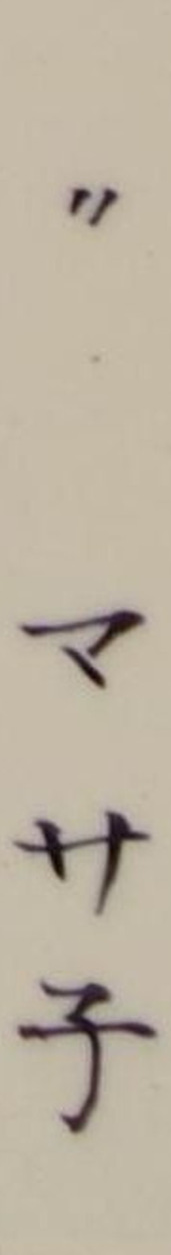マサ子
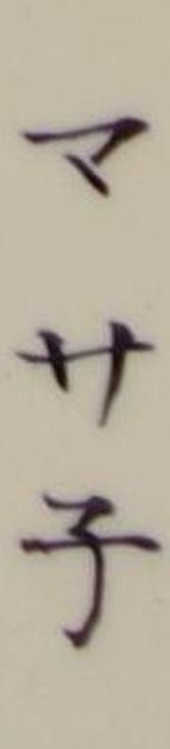マサ子
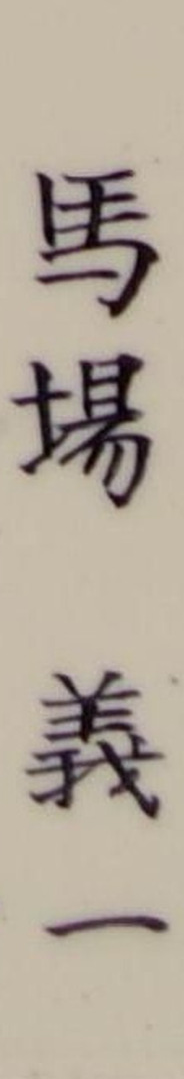馬場義一
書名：M~S
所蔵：高野山金剛峯寺
